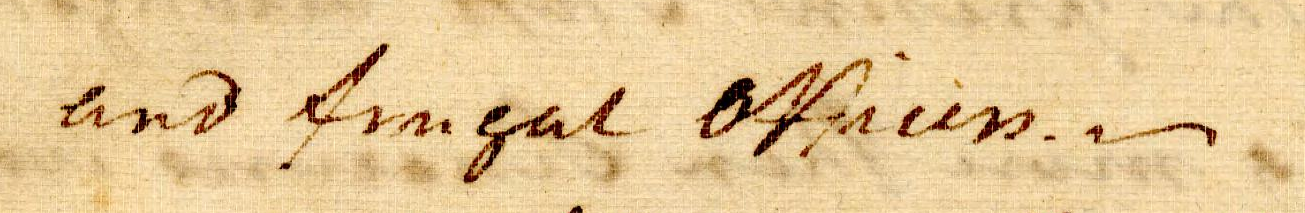and frugal Officers.-
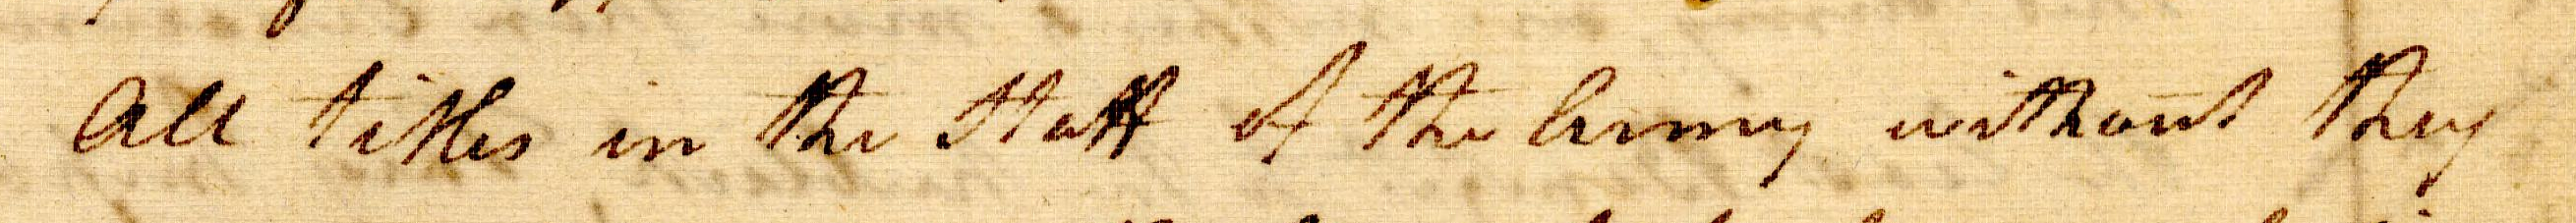All titles in the Staff of the Army without they
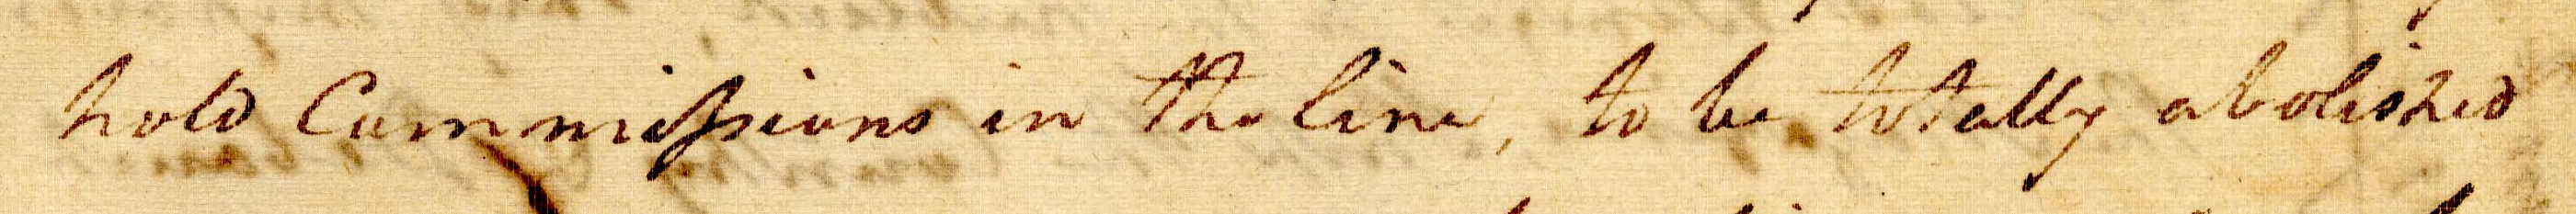hold Commissions in the line, to be totally abolished
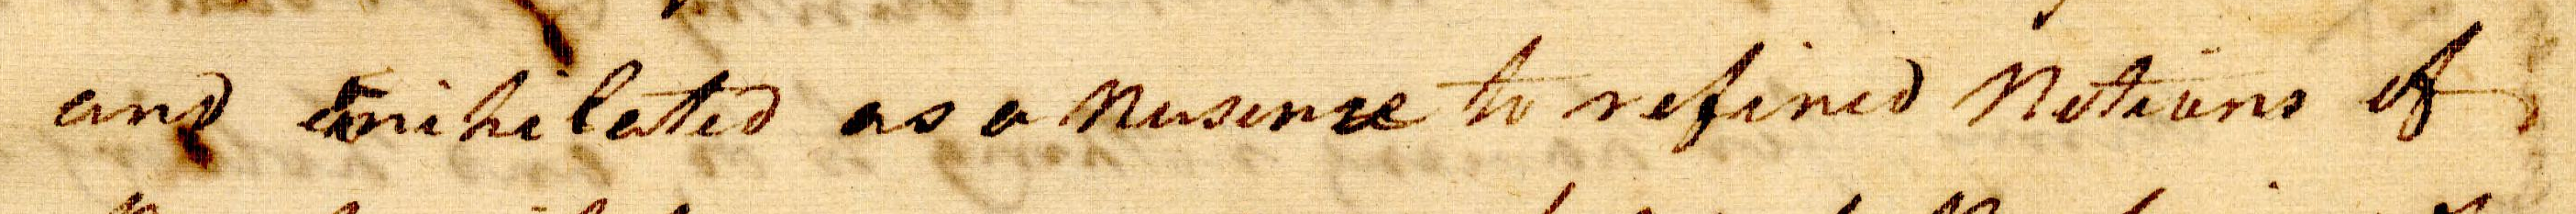and a^nnihilated as a nusence to refined Notions of
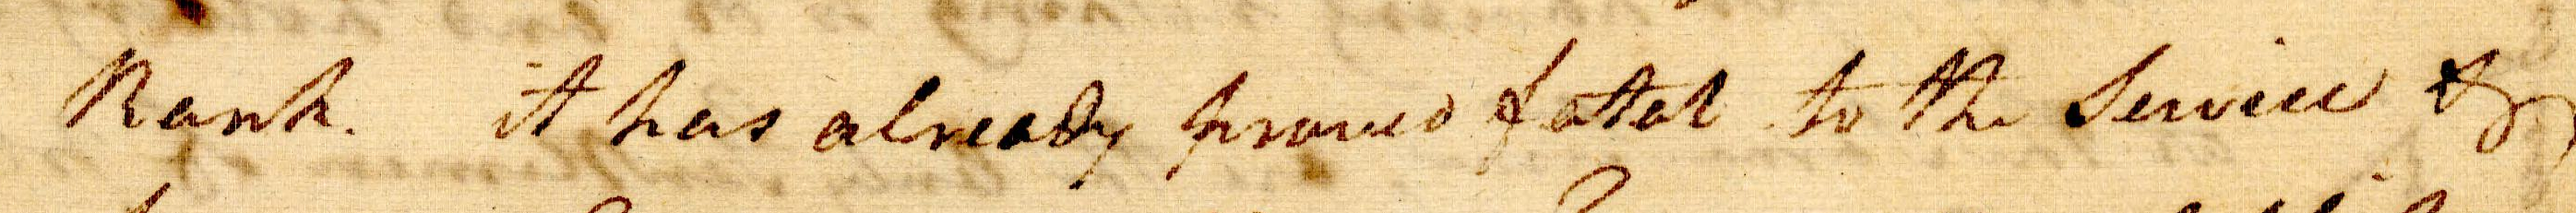Rank. it has already proved fattal to the Service &
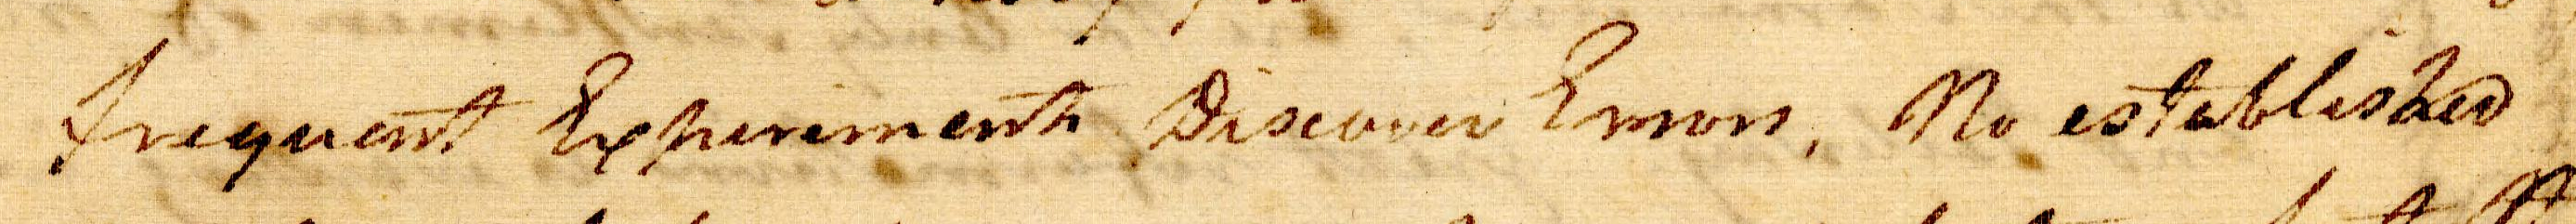frequent Experiments Discover Errors, No established
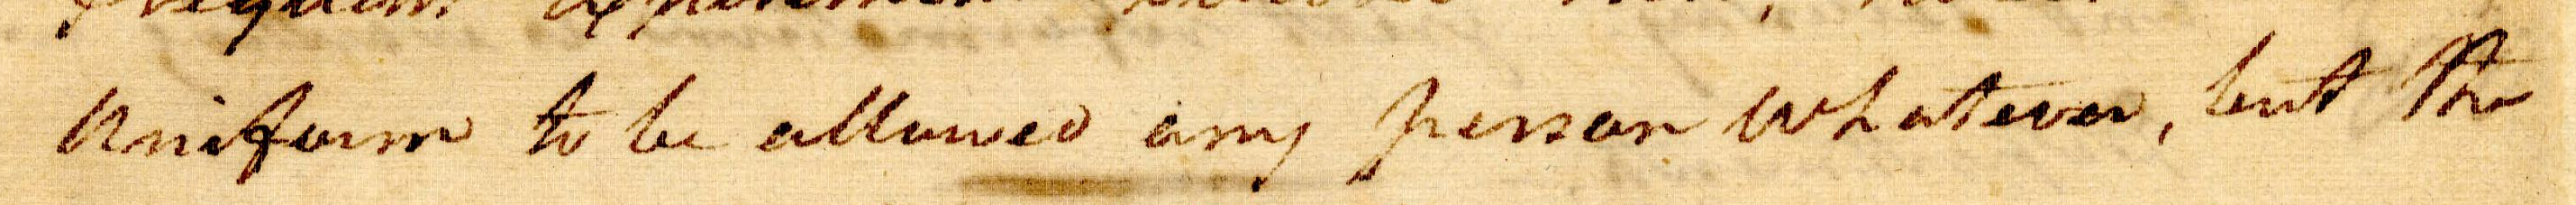Uniform to be allowed any person whatever, but the
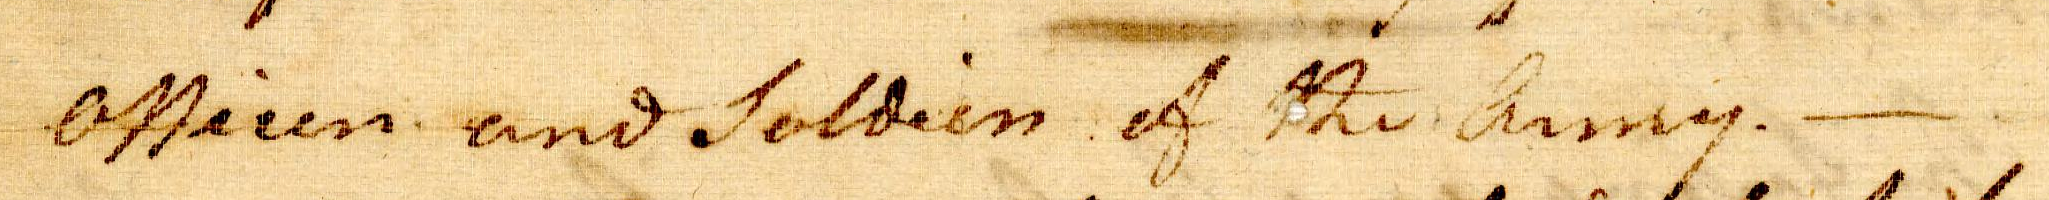Officer and Soldier of the Army.-
